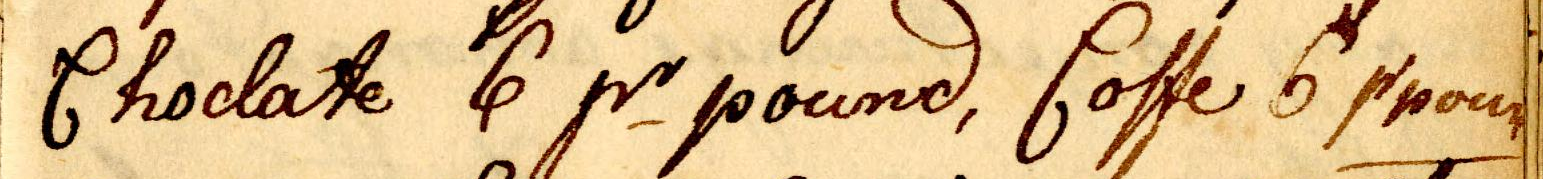Choclate 6 p^r pound, Coffe 6 p^r pound
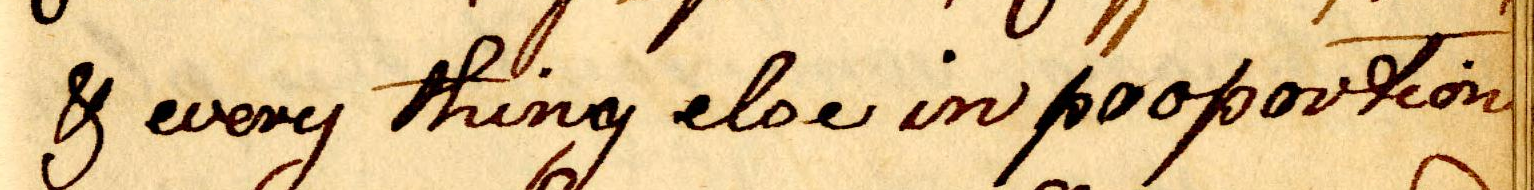& every thing else in proportion
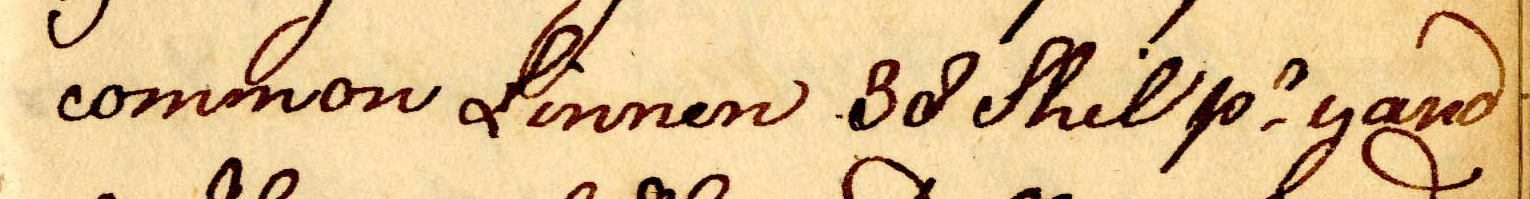common Linnen 38 Shil per yard
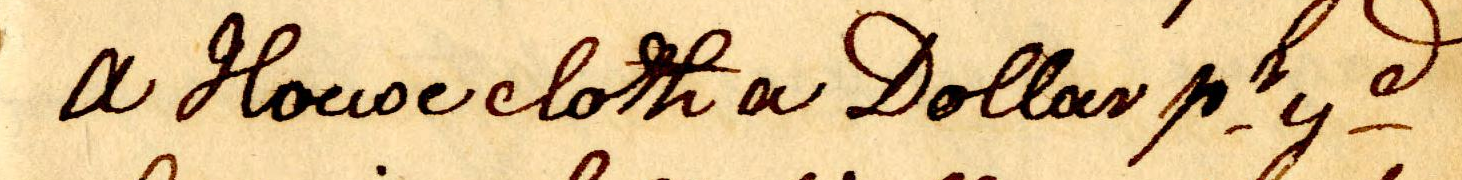A House cloth a Dollar p^r y^d
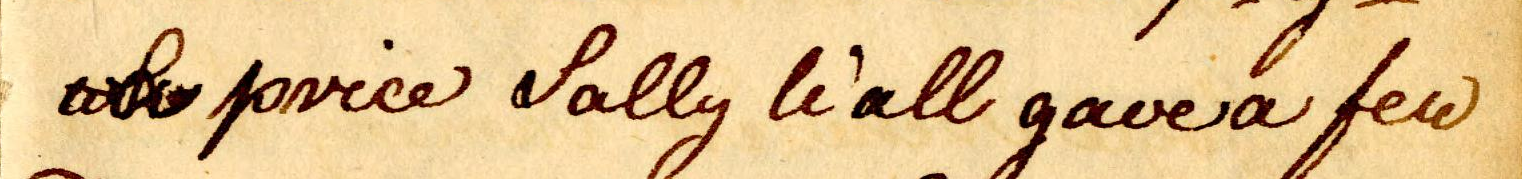[wh] price Sally Wall gave a few
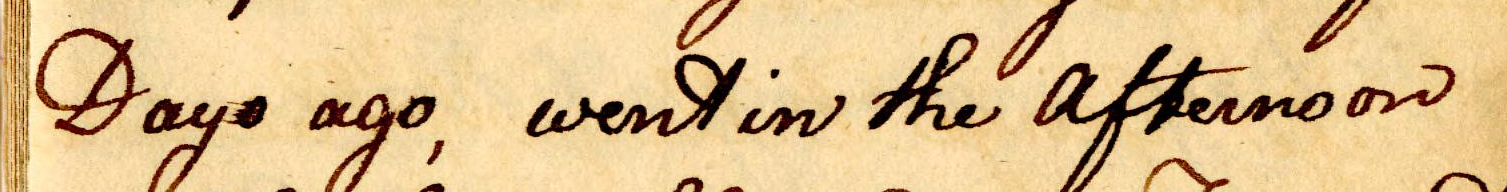Days ago, went in the Afternoon
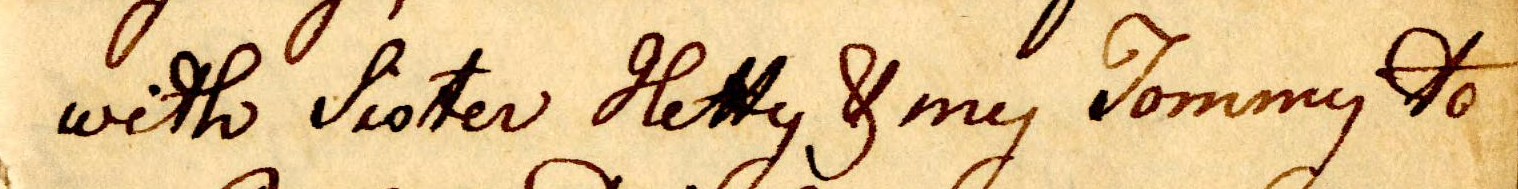with Sister Hetty & my Tommy to
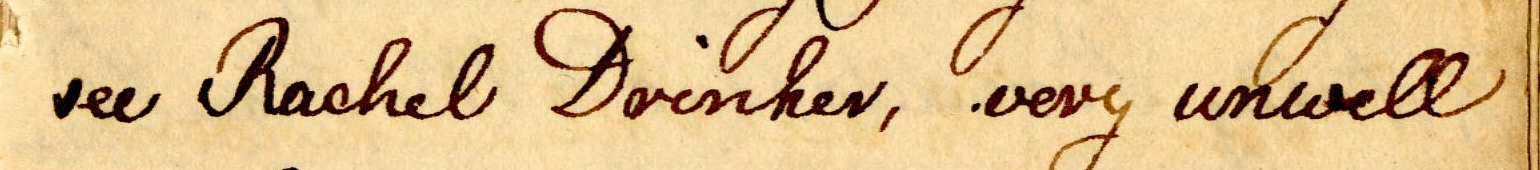see Rachel Drinker, very unwell
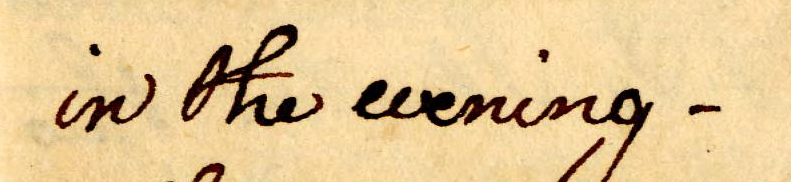in the evening-
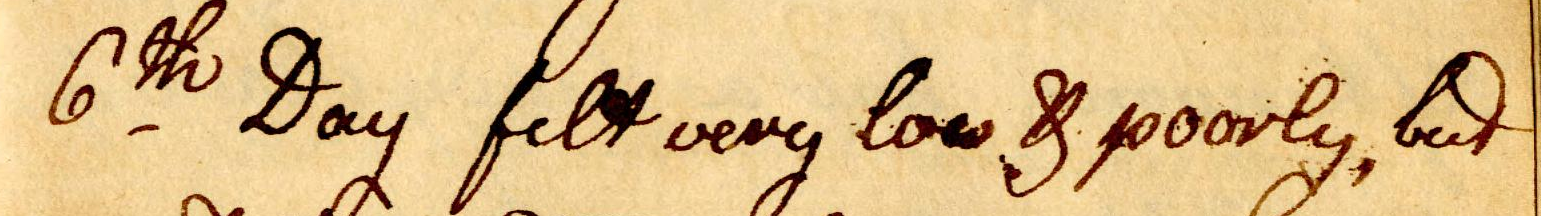6^th Day felt very low & poorly, but
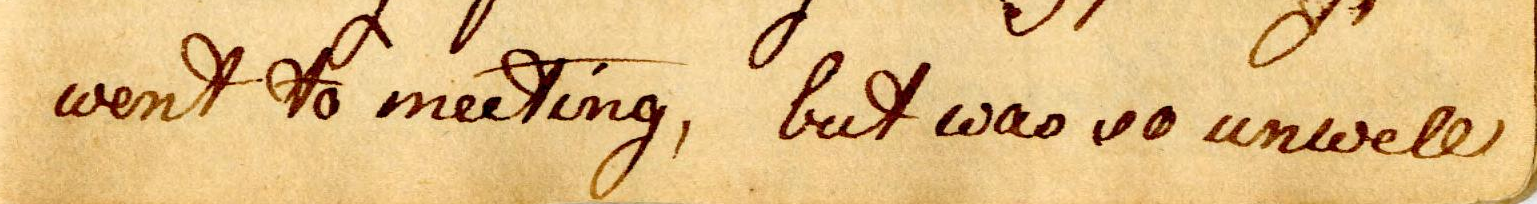went to meeting, but so unwell
